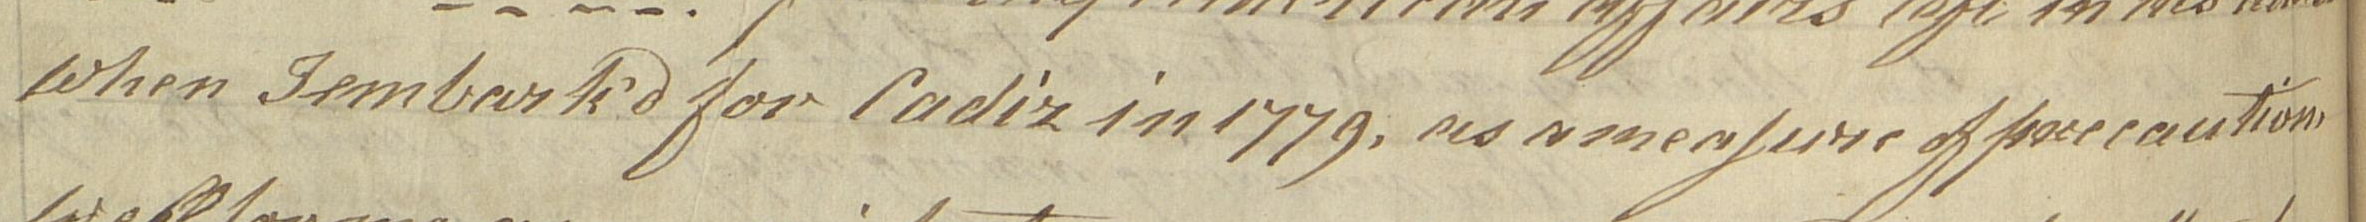when I embark'd for Cadiz in 1779, as a measure of precaution
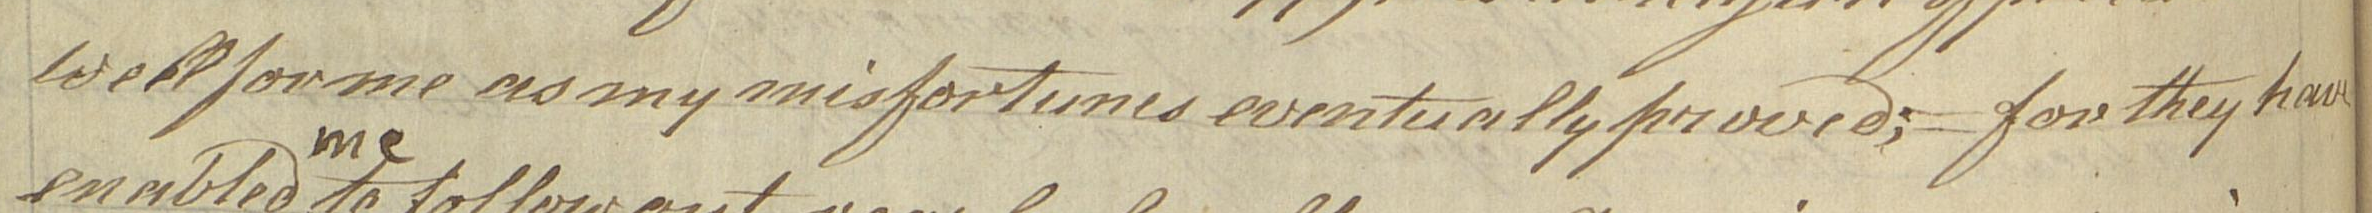well for me as my misfortunes eventually proved; for they have
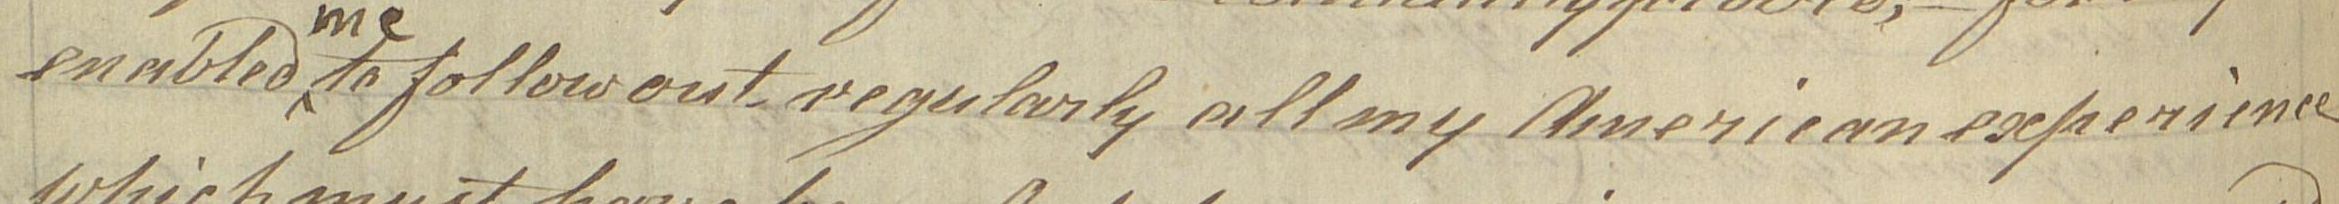enabled ^ to follow out regularly all my American experience
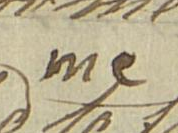me
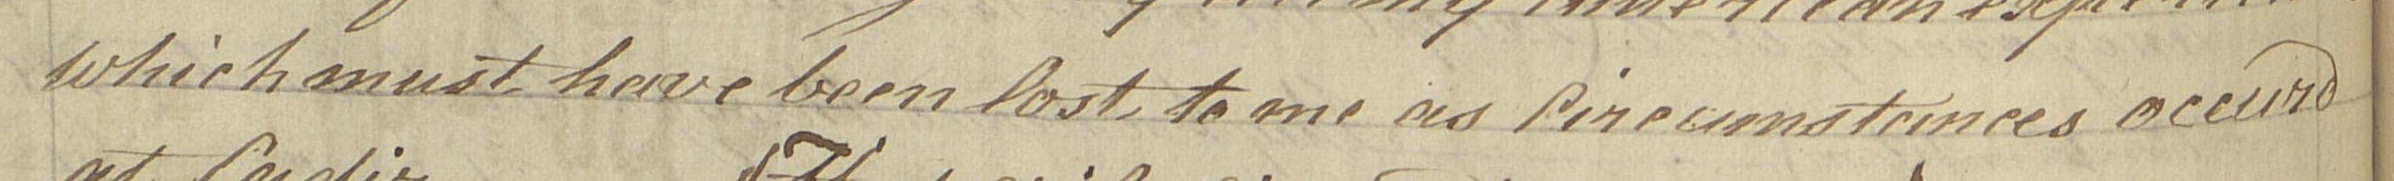which must have been lost to me as Circumstances occur'd
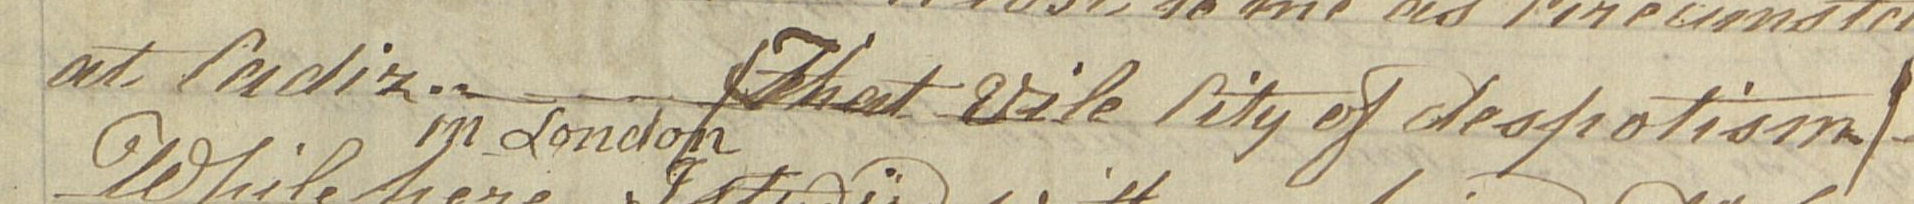at Cadiz. /That vile City of despotism/
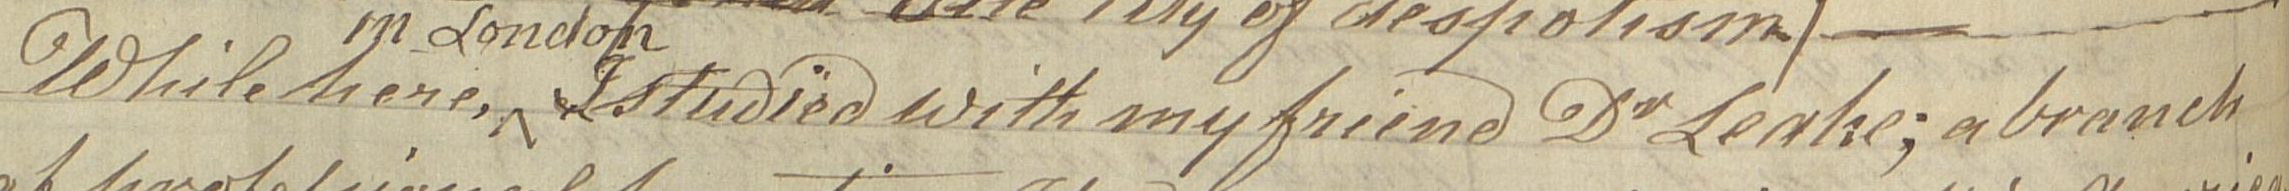While here, ^ I studied with my friend D^r Leake; a branch
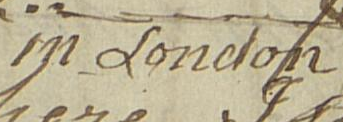in London
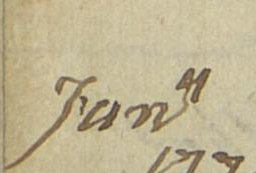Jan^y.
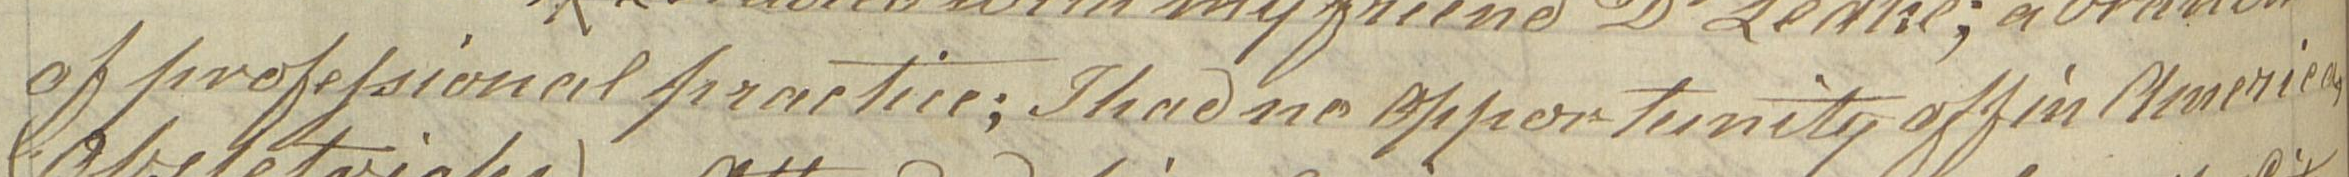of professional practice; I had no opportunity off in America,
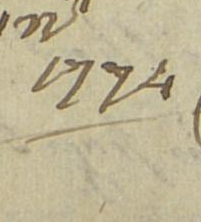1774
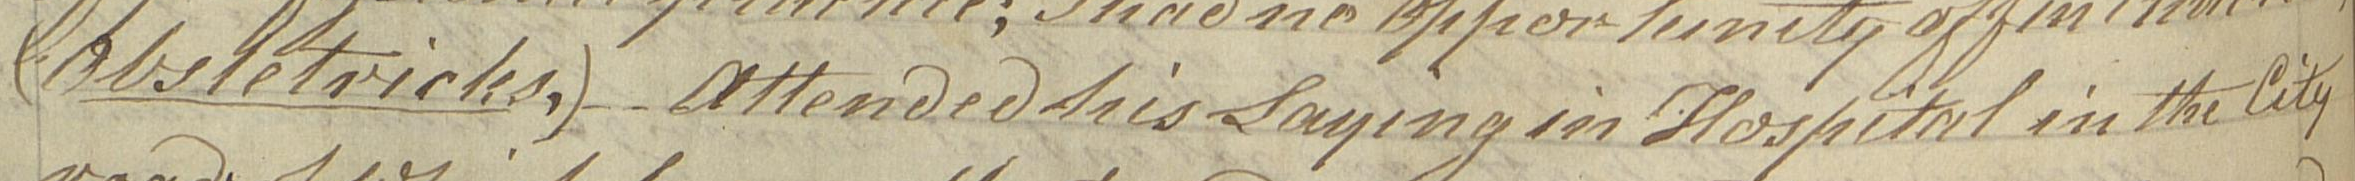(Obstetricks,) Attended his Saying in Hospital in the City
